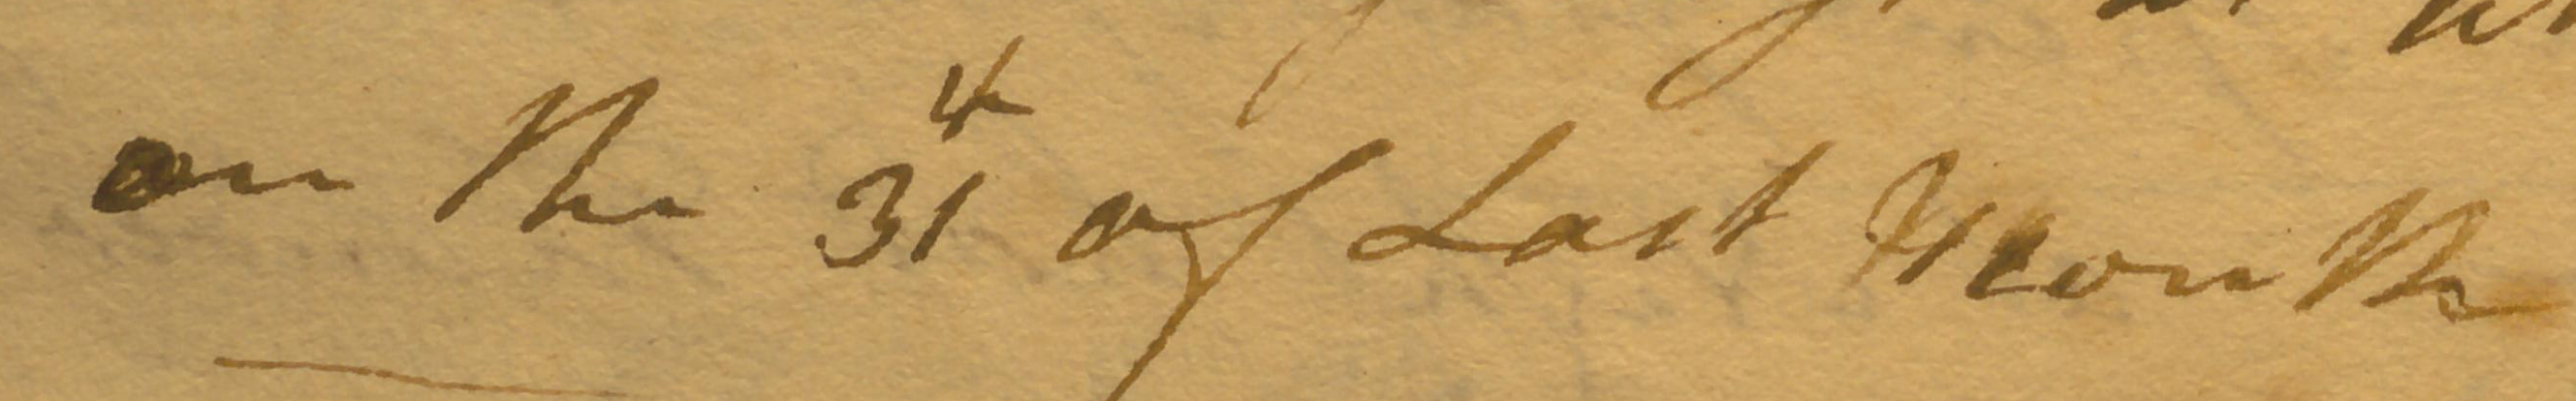on the 31^th of Last Month
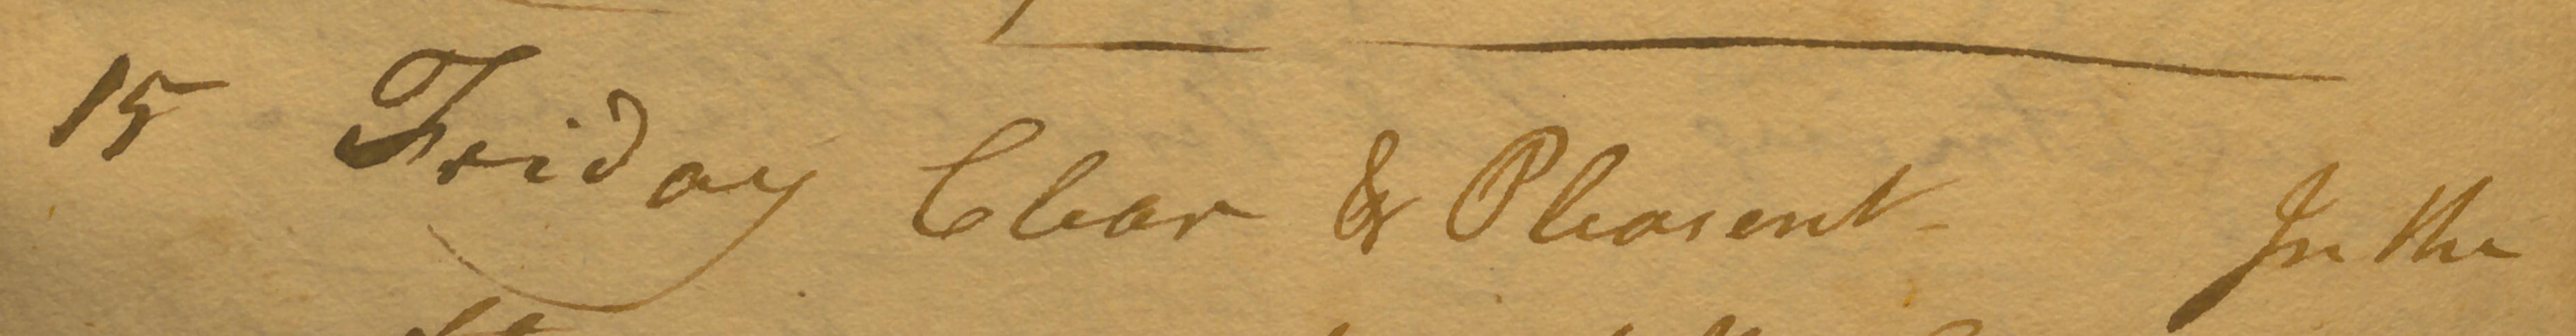15 Friday Clear & Pleasent In the
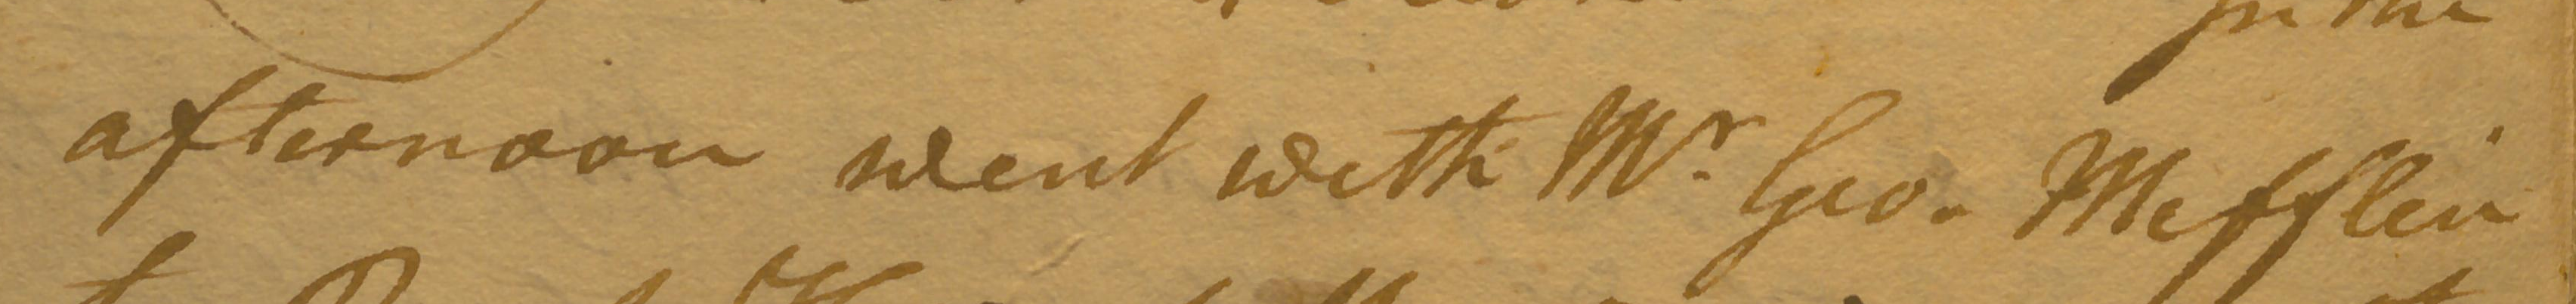afternoon went with M^r. Geo. Mifflin
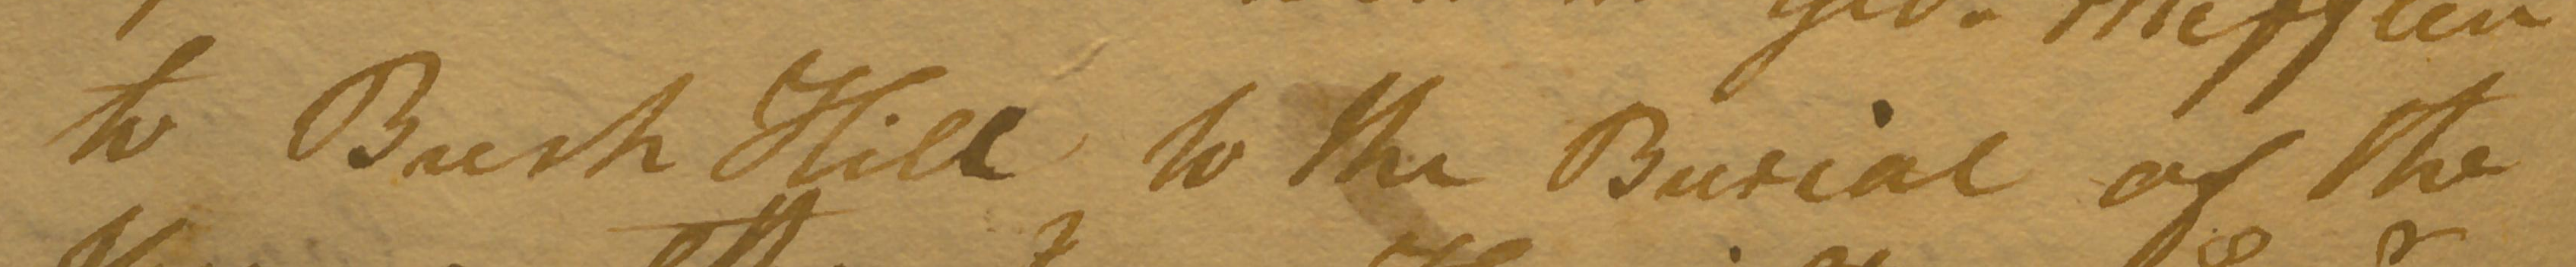to Bush Hill to the Burial of the
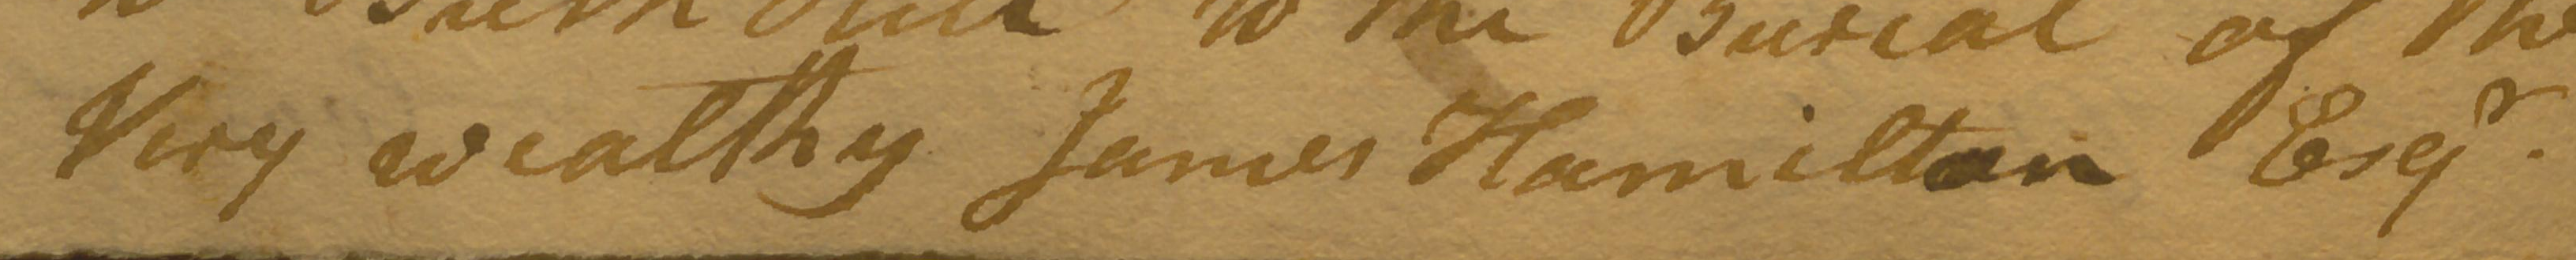Very wealthy James Hamilton Esq^r.
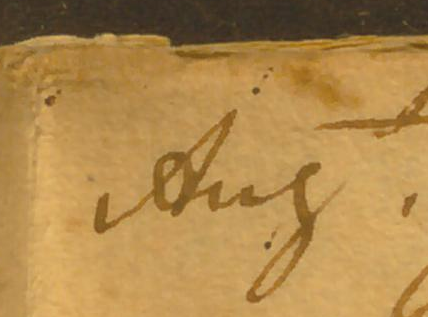Aug^t.
